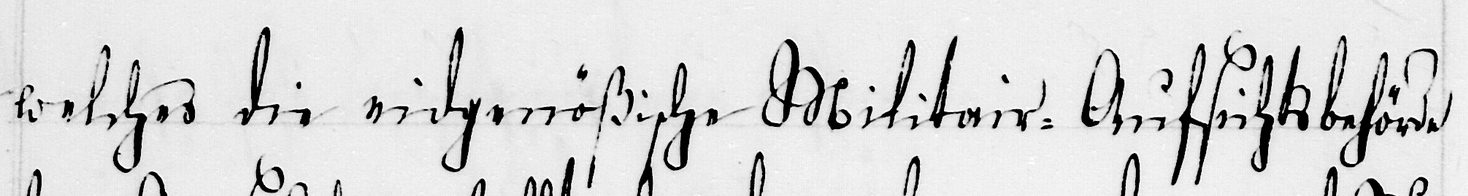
welches die eidgenößische Militair-Aufsichtsbehörde
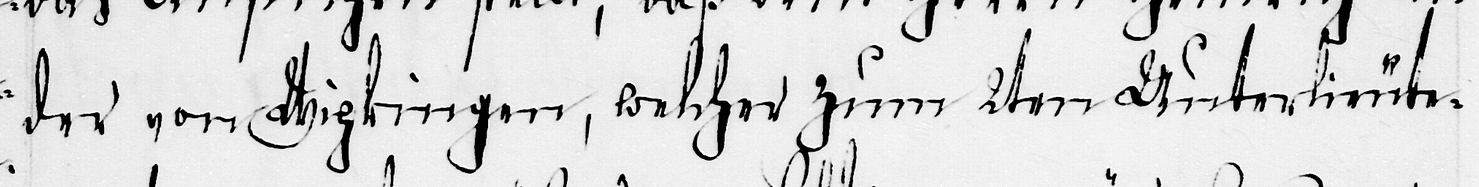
der von Wipkingen, welcher zum 2ten Unterlieute¬
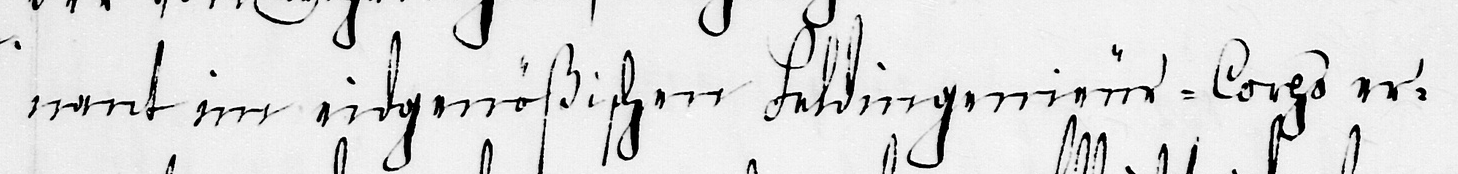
nant im eidgenößischen Feldingenieur-Corps er¬
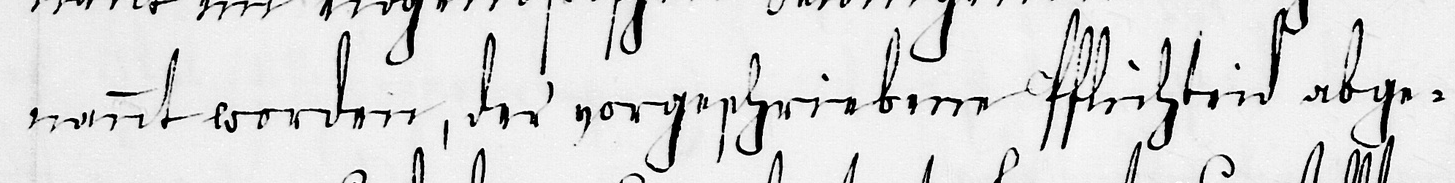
nannt worden, der vorgeschriebene Pflichteid abge¬
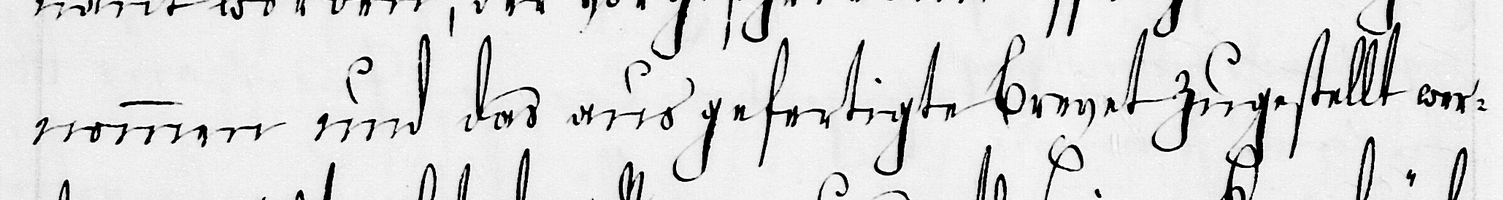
nommen und das ausgefertigte Brevet zugestellt we¬
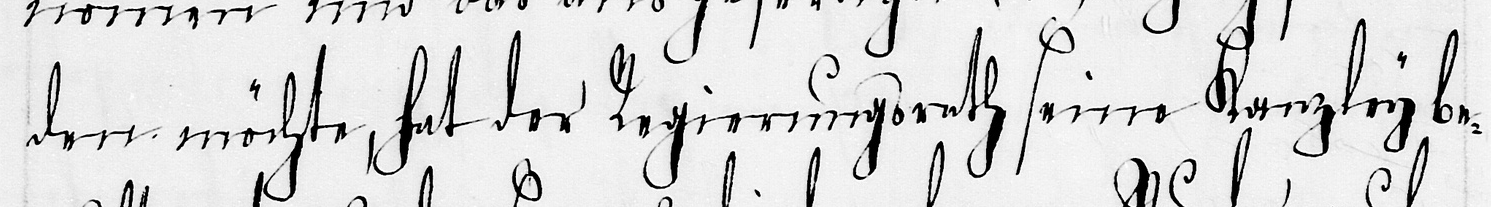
rden möchte, hat der Regierungsrath seine Kanzley be¬
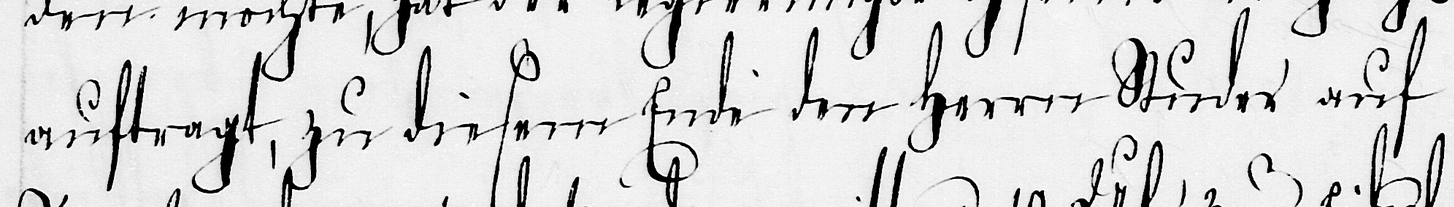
auftragt, zu diesem Ende den Herrn Studer auf
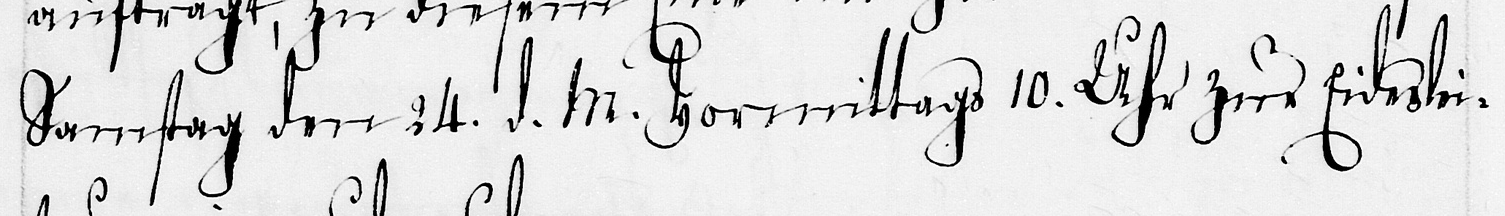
Samstag den 24. d. M. Vormittags 10. Uhr zur Eideslei¬
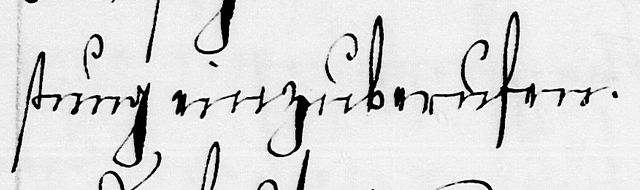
stung einzuberufen.
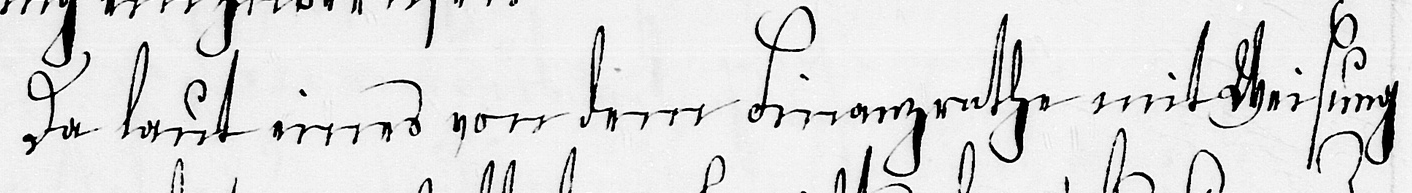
Da laut eines von dem Finanzrathe mit Weisung
